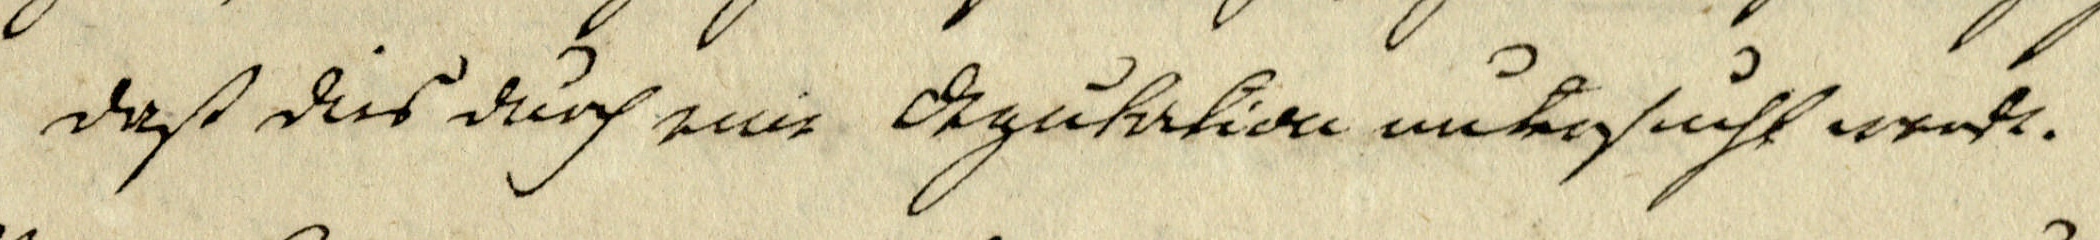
daß dies durch eine Deputation untersucht werde.
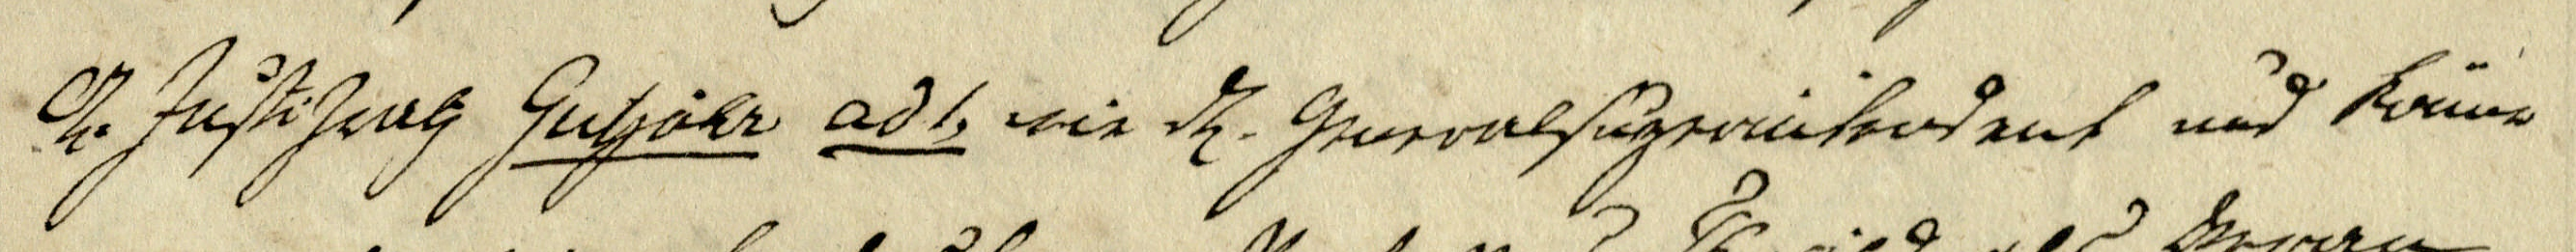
dh. Justizrath Gutjahr ad 1, wie dh. Generalsuperintendent und könne
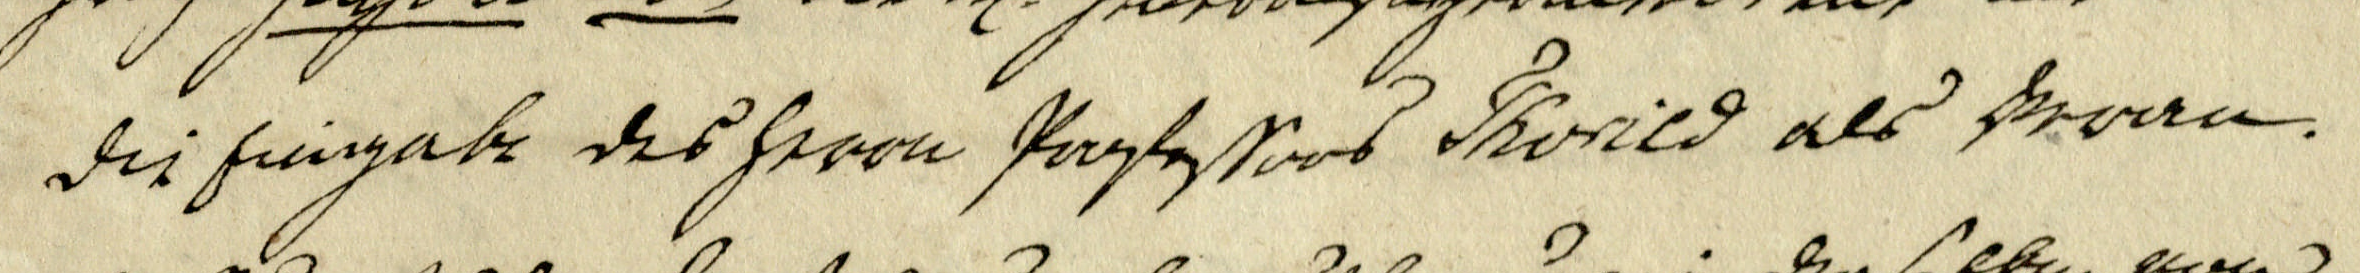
die Eingabe des Herrn Professors Thorild als Veran¬
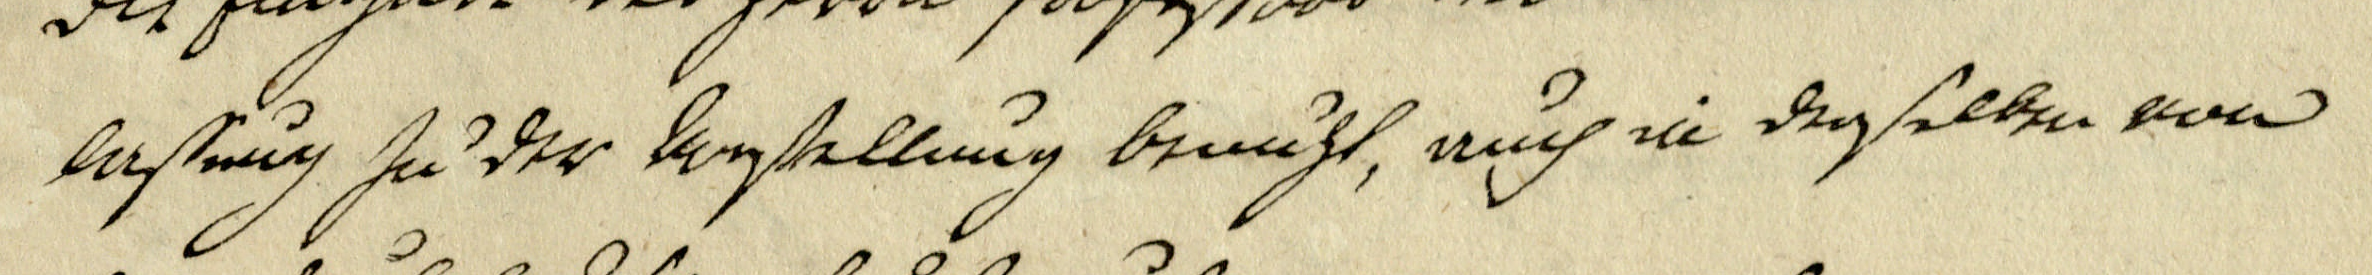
lassung zu der Vorstellung benutzt, auch in derselben von
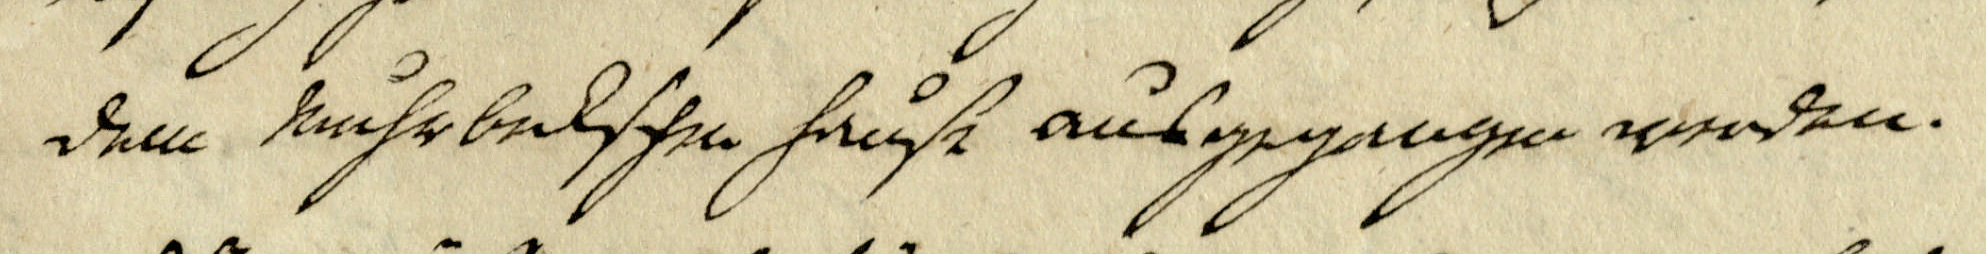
dem Muhrbeckschen Hause ausgegangen werden.
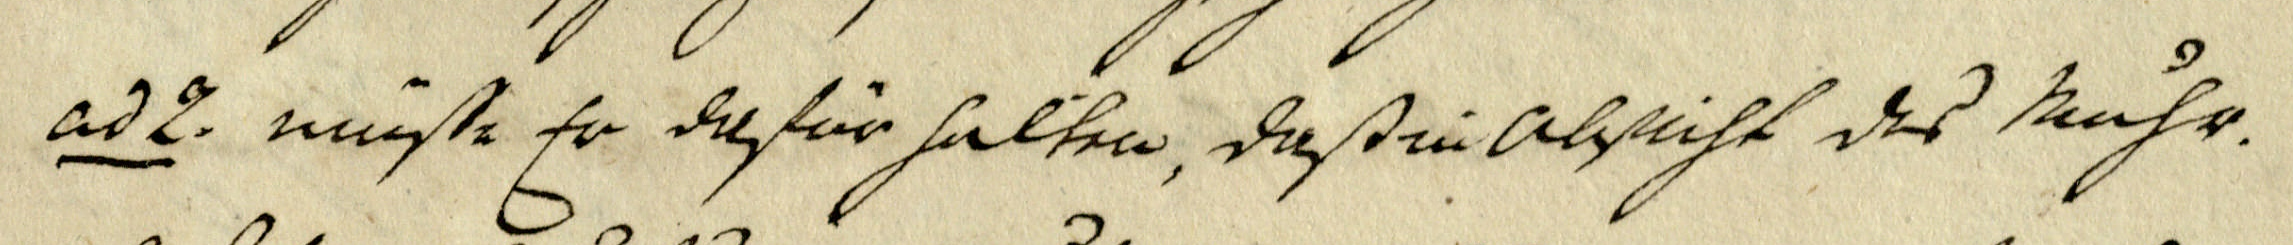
ad 2. müsse Er dafür halten, daß in Absicht des Muhr¬
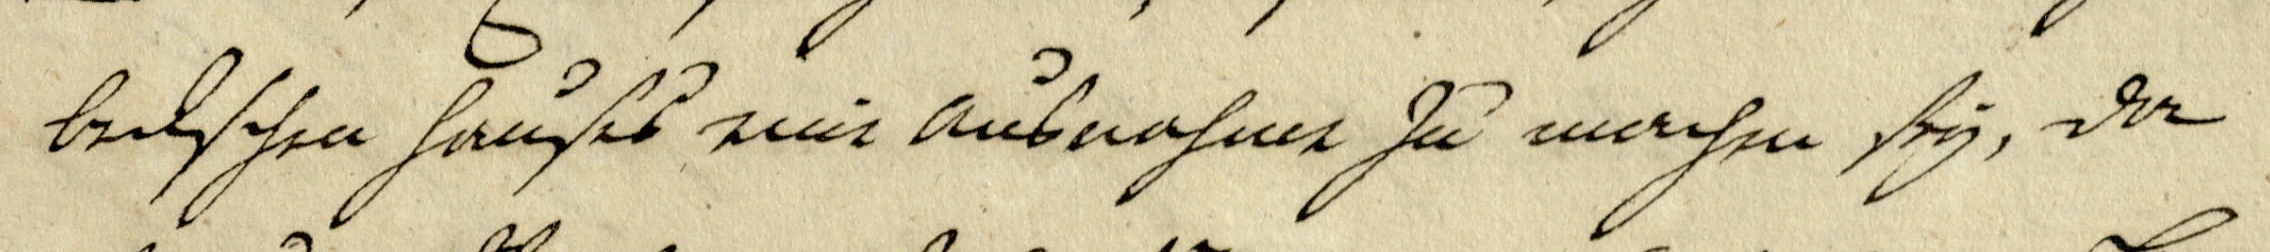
beckschen Hauses eine Ausnahme zu machen seÿ, da
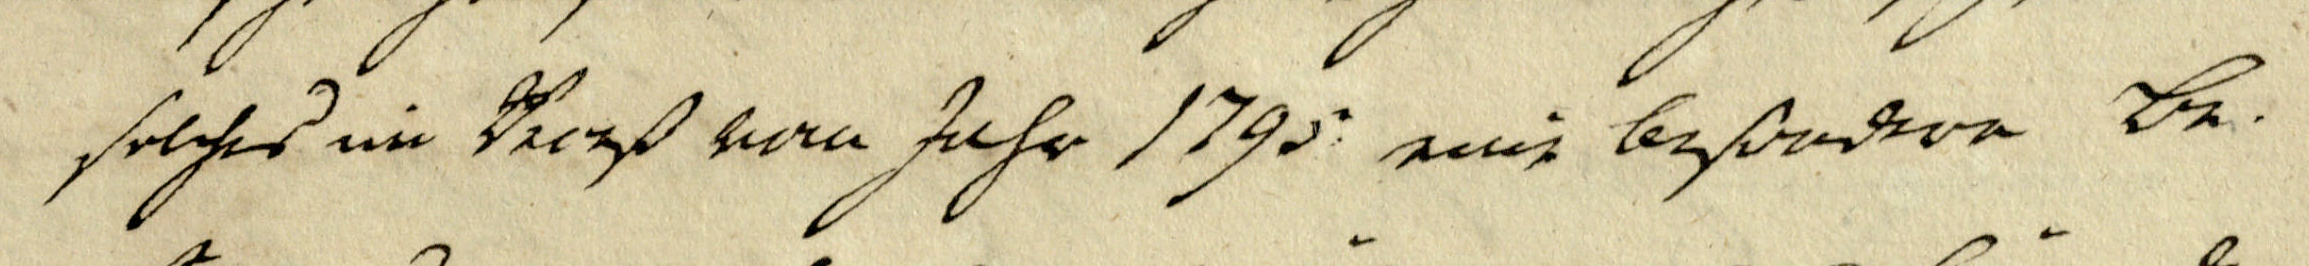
solches im Receß von Jahr 1795 eine besondere Be¬
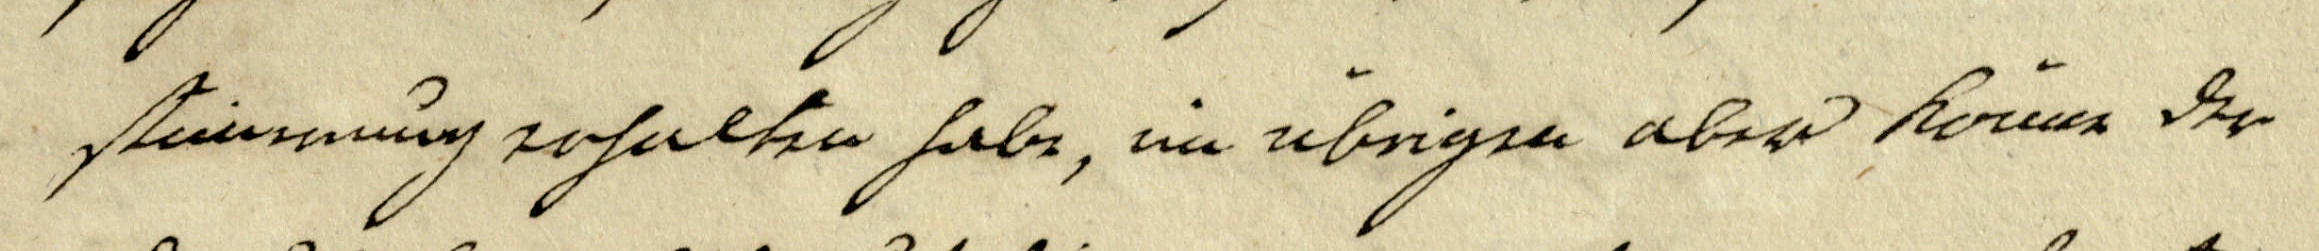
stimmung erhalten habe, in übrigen aber könne der
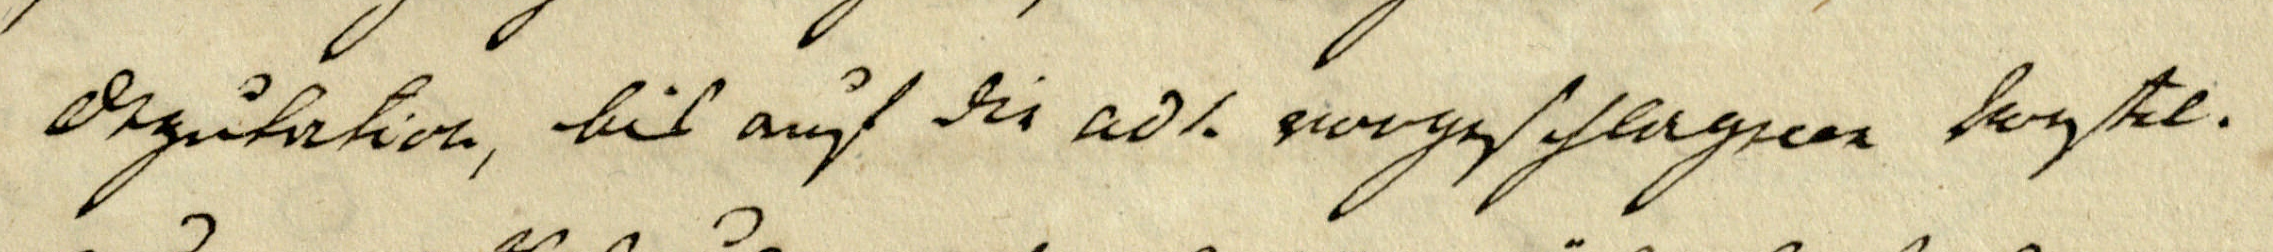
Deputation, bis auf die ad 1. vorgeschlagene Vorstel¬
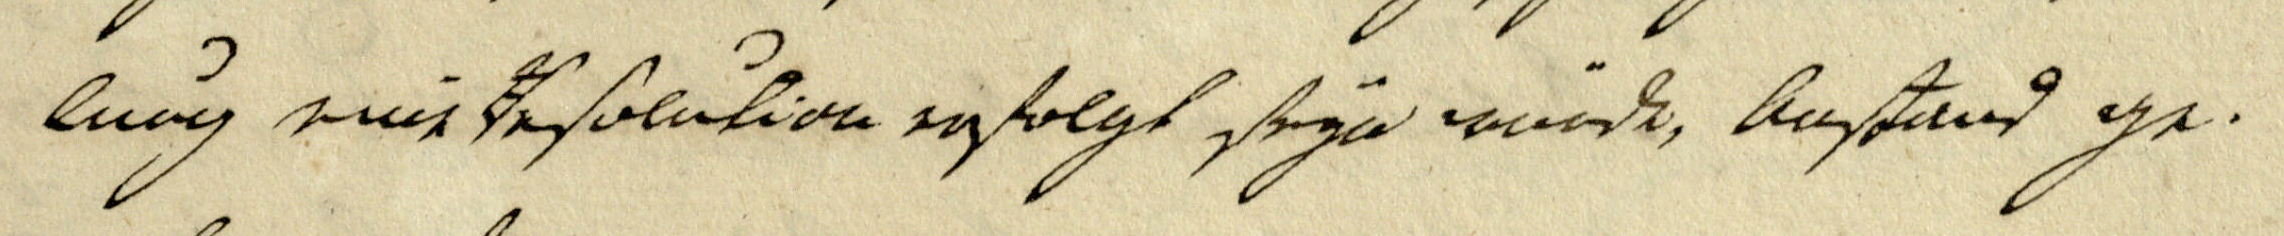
lung eine Resolution erfolgt seÿn würde, Anstand ge¬
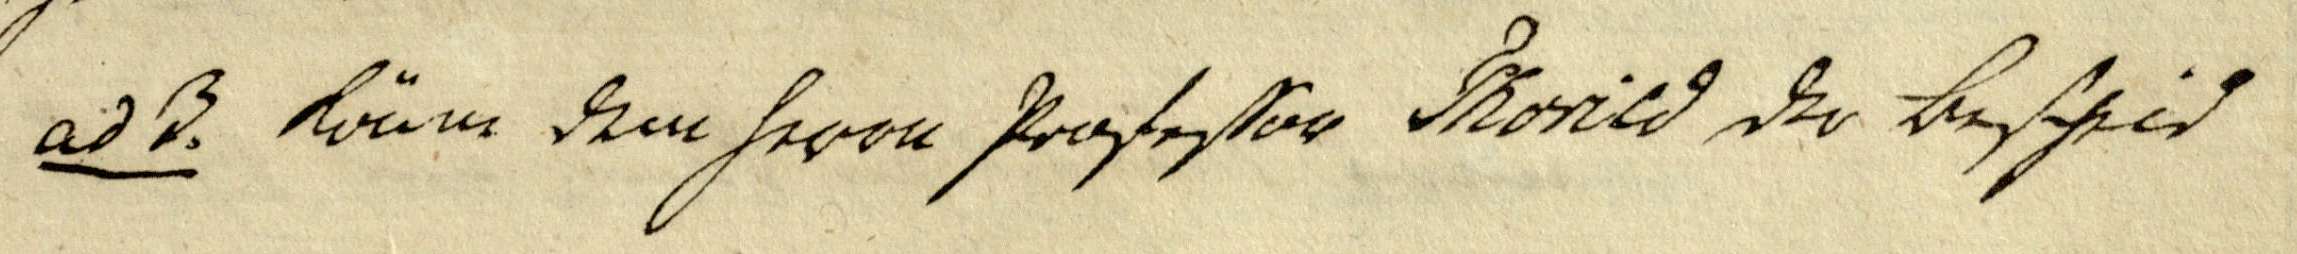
ad 3. könne dem Herrn Professor Thorild der Bescheid
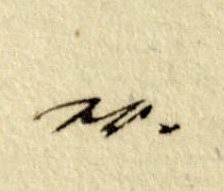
er
